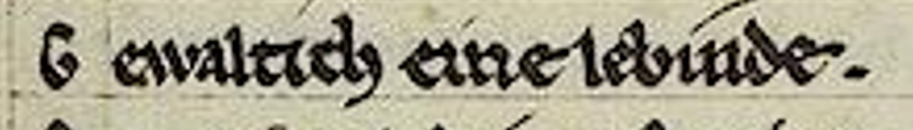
Gewaltich eine lebinde.
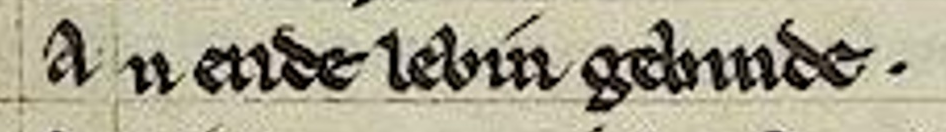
An ende lebin gebinde.
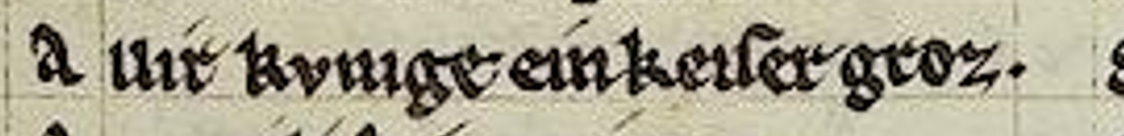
Allir kvnige ein keiſer groz.
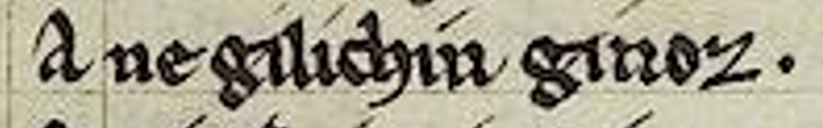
Ane gilichin ginoz.
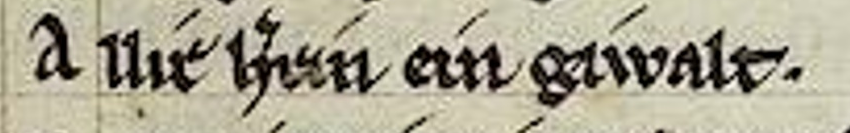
Allir h(er)rin ein giwalt.
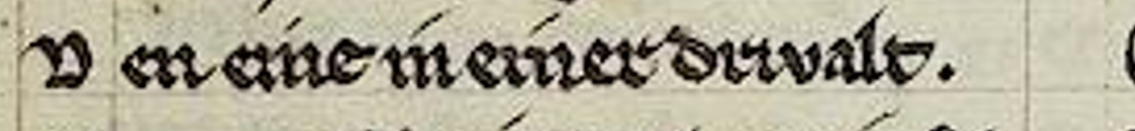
Den eine in einer drivalt.
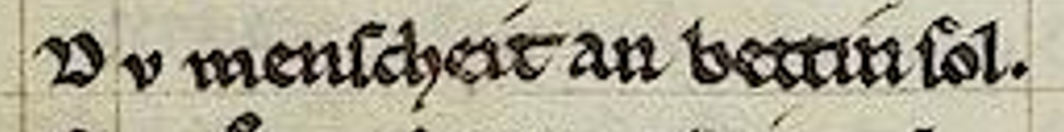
Dv menſcheit an bettin ſol.
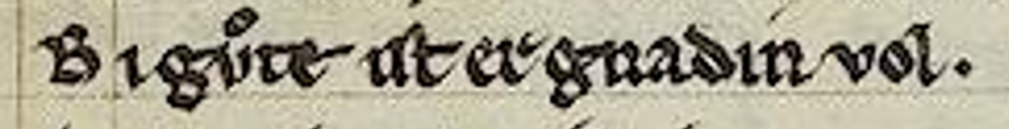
Bi gv°ote iſt er gnadin vol.
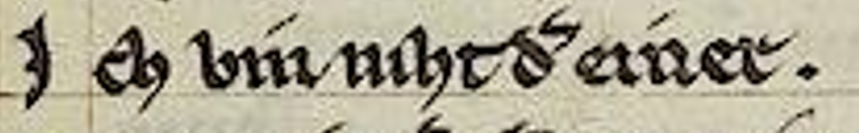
Ich bin niht d(er) einer.
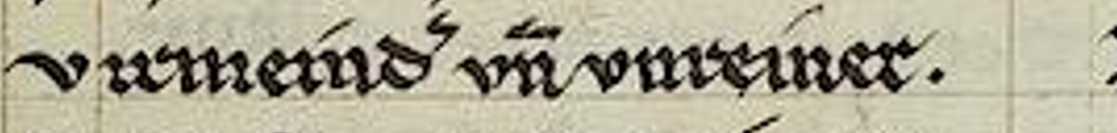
Virmeind(er) vn(d) vnreiner.
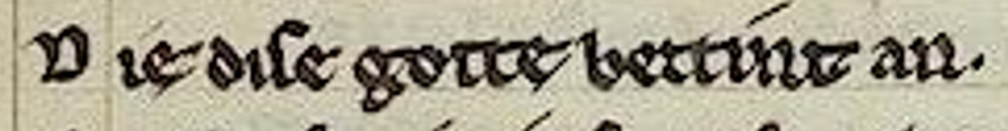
Die diſe gotte bettint an.
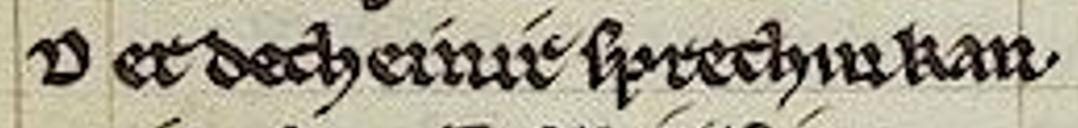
Der dech einir ſprechin kan.
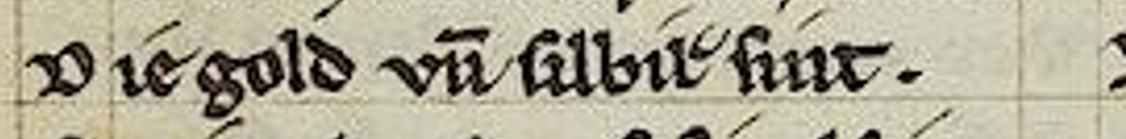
Die gold vn(d) ſilbir ſint.
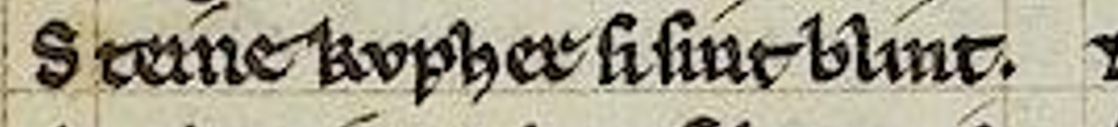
Steine kvpher ſi ſint blint.
